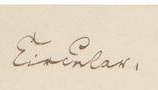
Circular
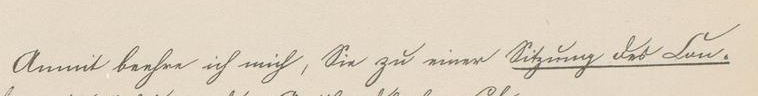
Anmit beehre ich mich, Sie zu einer Sitzung des Con-
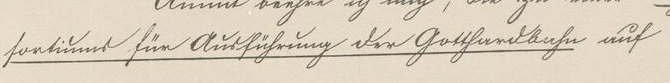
sortiums für Ausführung der Gotthardbahn auf
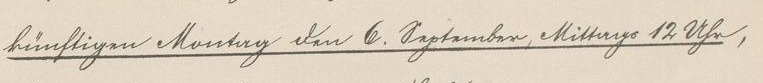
künftigen Montag den6. September, Mittags 12 Uhr,
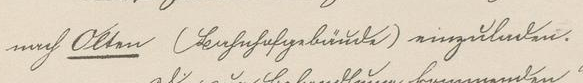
nach Olten (Bahnhofgebäude) einzuladen.
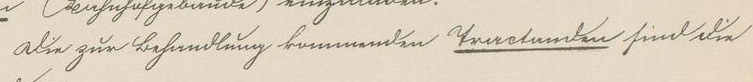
Die zur Behandlung kommenden Tractanden sind die
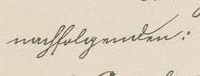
nachfolgenden:
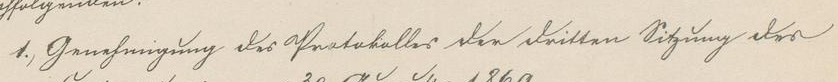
1.) Genehmigung des Protokolles der dritten Sitzung des
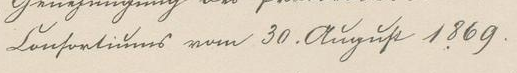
Consortiums vom 30. August 1869.
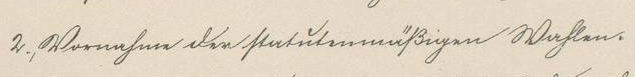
2.) Vornahme der statutenmäßigen Wahlen.
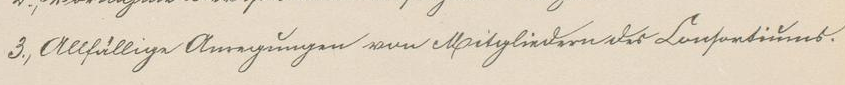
3.) Allfällige Anregungen von Mitgliedern des Consortiums.
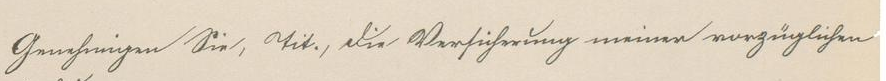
Genehmigen Sie, Tit., die Versicherung meiner vorzüglichen
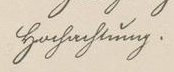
Hochachtung.
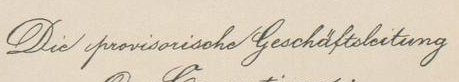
Die provisorische Geschäftsleitung
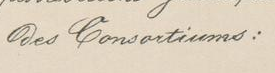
des Consortiums:
